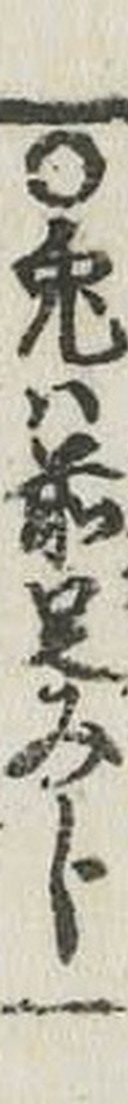○兎は前足みじ
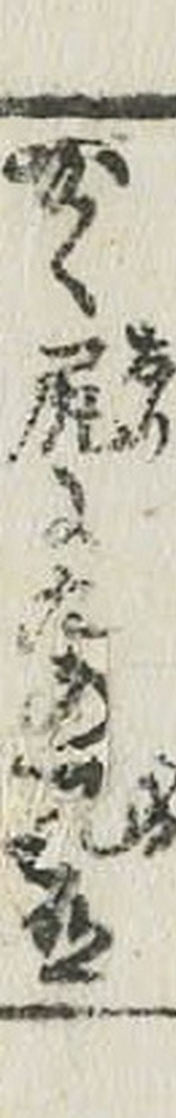かく尻に九の孔有
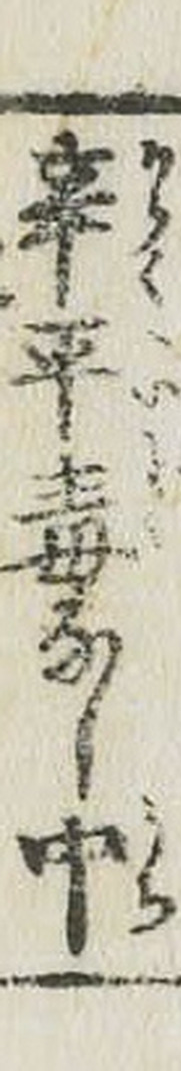辛平毒なし中
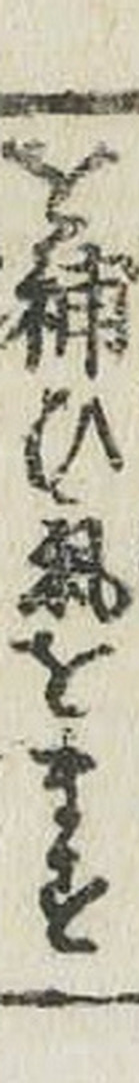を補ひ気をます
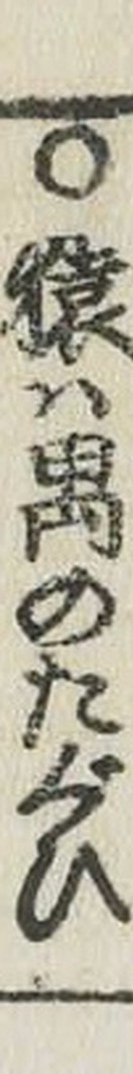○猿は禺のたぐひ
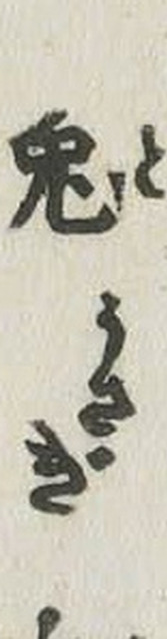兎うさぎ
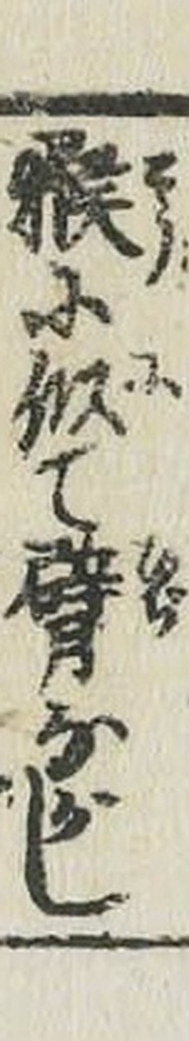猴に似て臂ながし
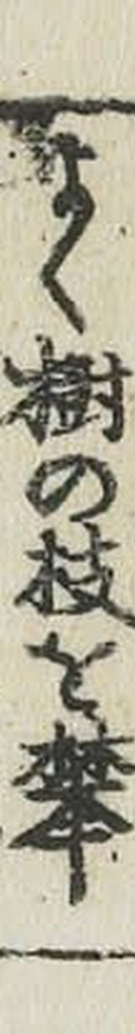よく樹の枝を攀
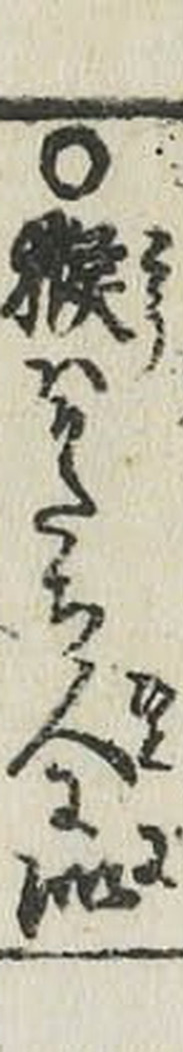○猴はかたち人に似
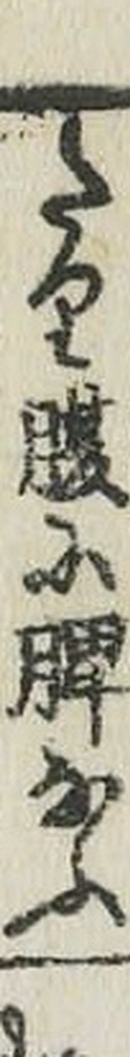たり腹に脾なふ
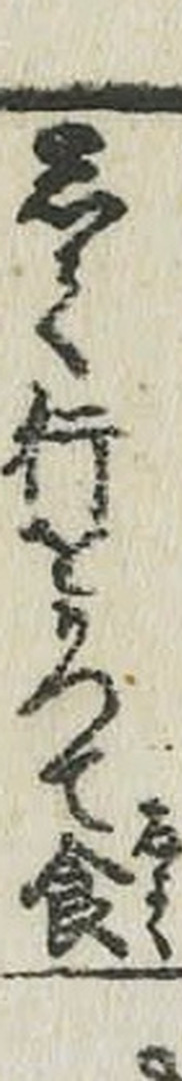して行をかつて食
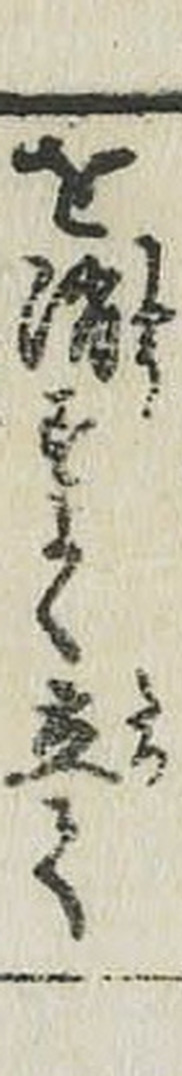を消すよく立て
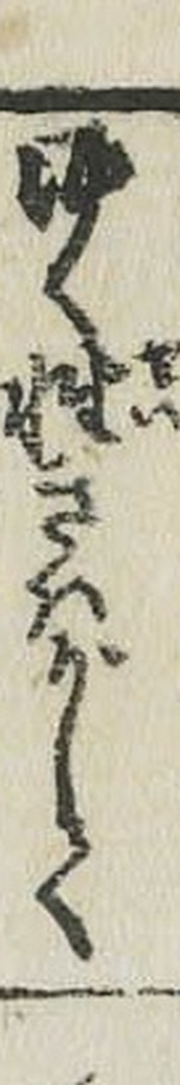ゆく性さはがしく
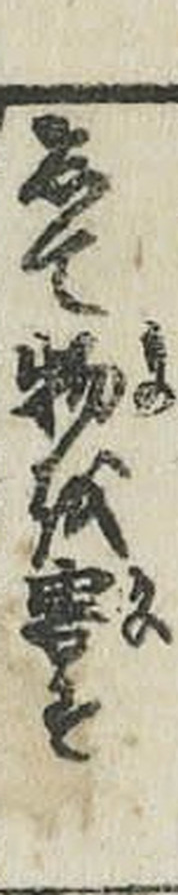して物を害す

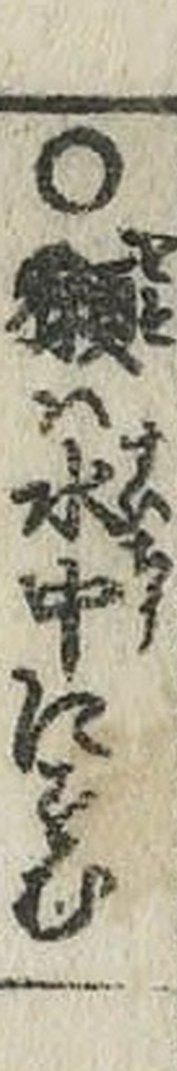○獺は水中にすむ
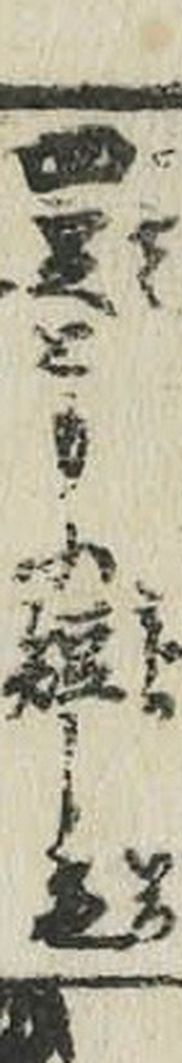四足ともに短し色
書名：増補頭書訓蒙図彙大成 10巻 6:巻之12-13
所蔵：東京学芸大学教育コンテンツアーカイブ
